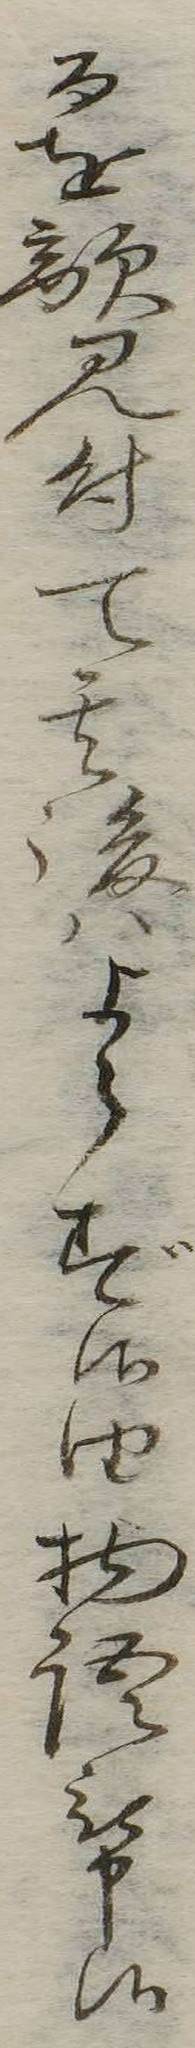るを敵見付て其後はよらず候由物語被申候
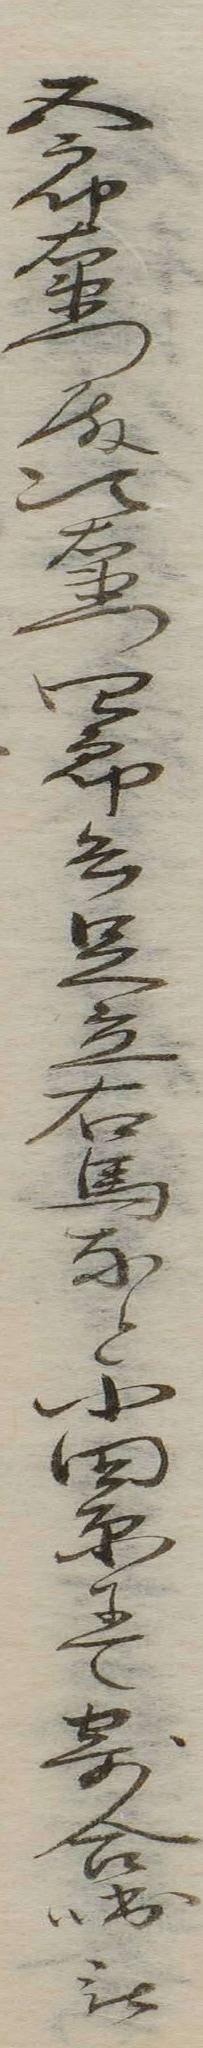一五郎右衛門殿次右衛門四郎兵足立右馬など小田原にて寄合咄被
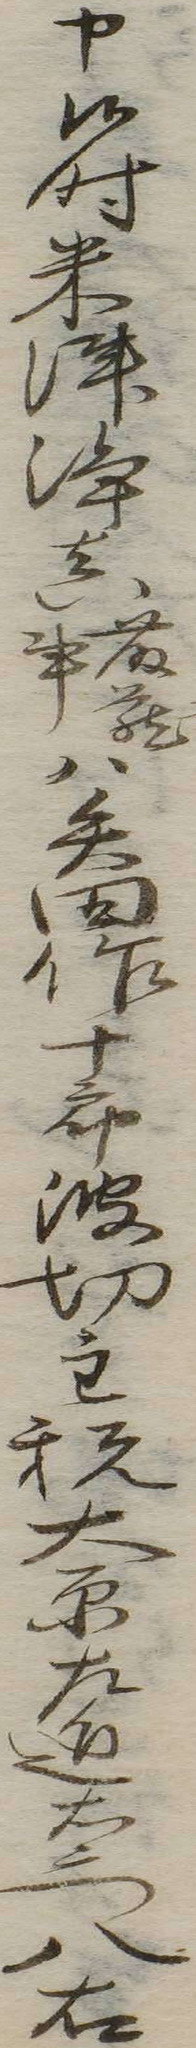申候時米津真藤蔵事は矢田作十郎波切主税大原左近右衛門八右
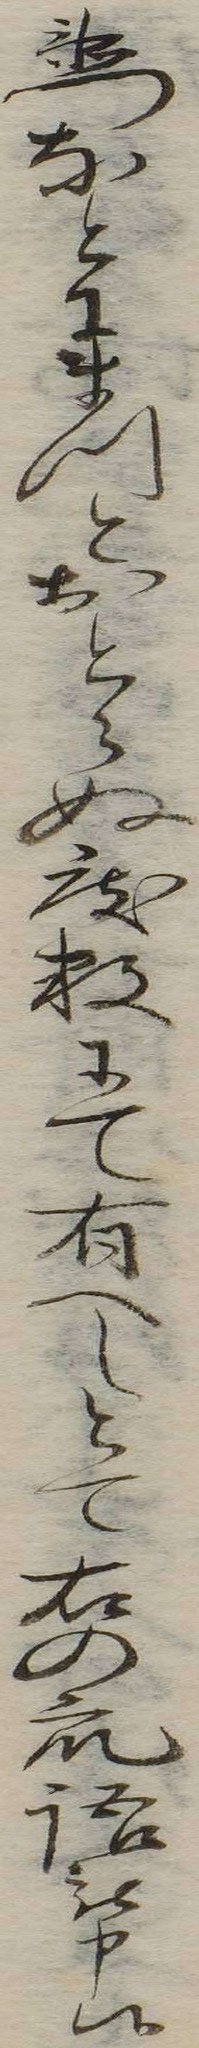衛門なとにまつとおとらぬ度数にて有へしとて右の衆語被申候
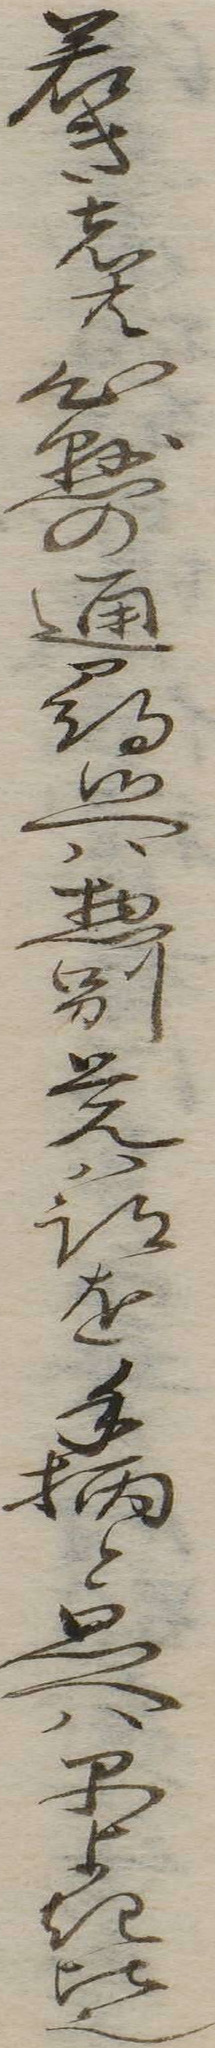若き者は心懸の通尋候へは惣別覚は跡を手柄と思えは早よき比也
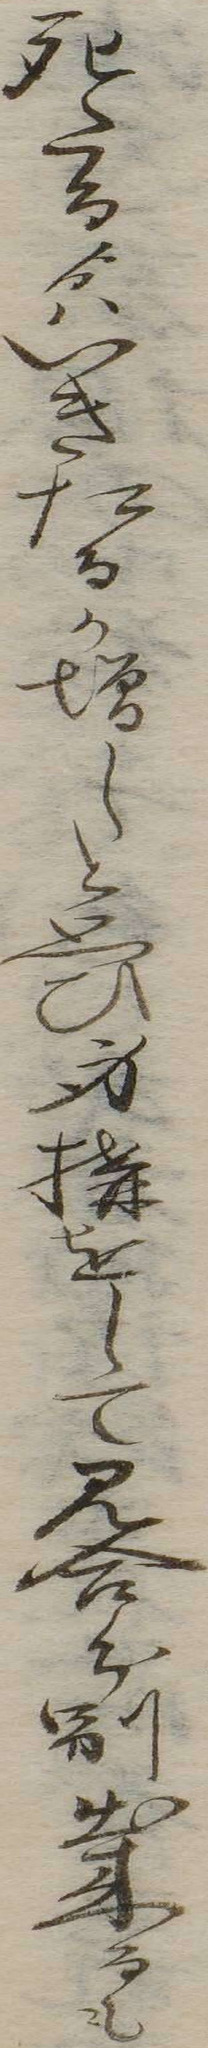死たるよりはいきたるか増しと思ひ身構をして見合分別出来るも
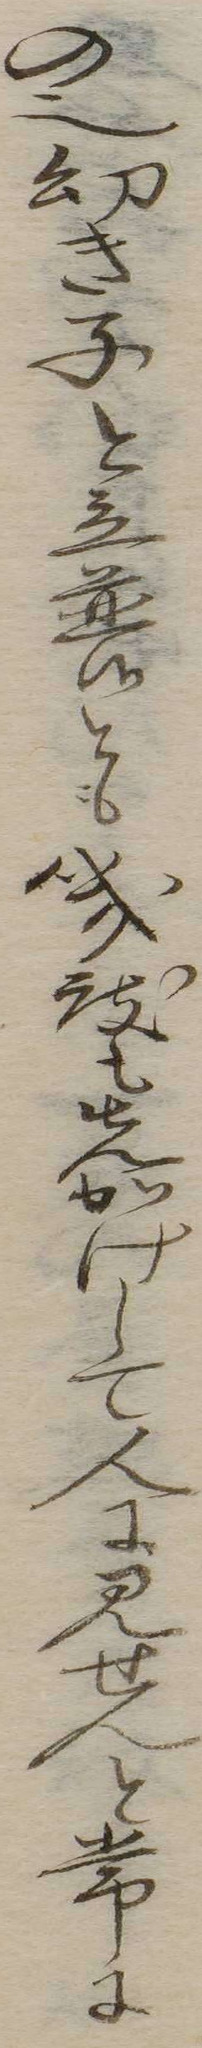の也幼き子と立並候とも幾度も先かけして人に見せんと常に

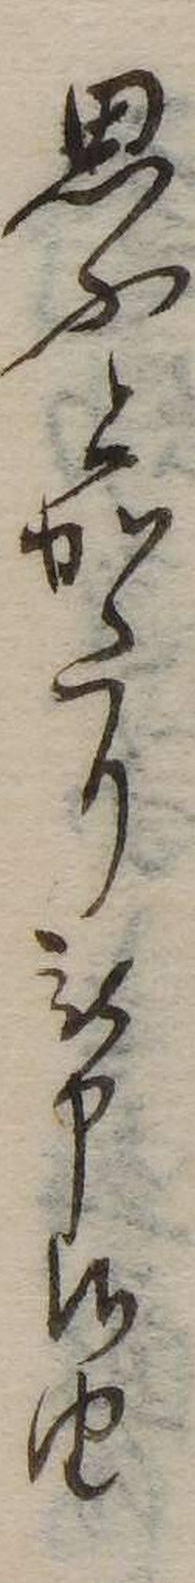思ふとかたり被申候由
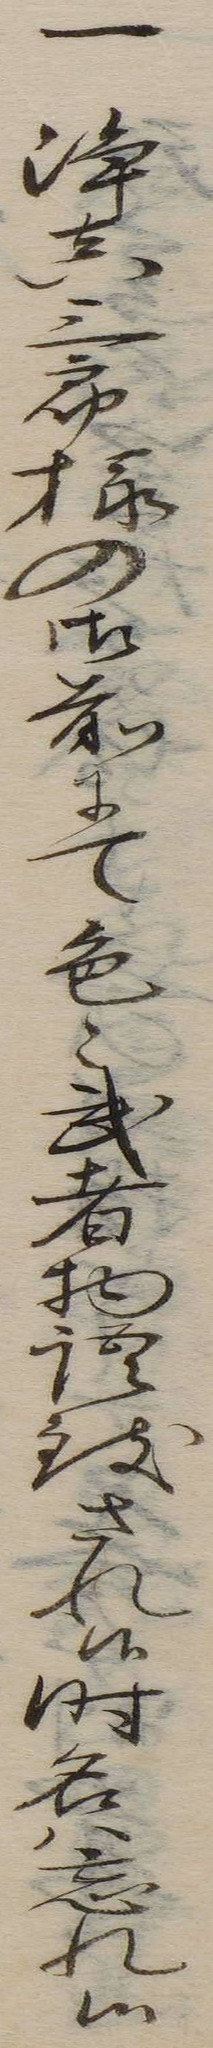一浄真三郎様の御前にて色ゝ武者物語致され候時名は忘れ候
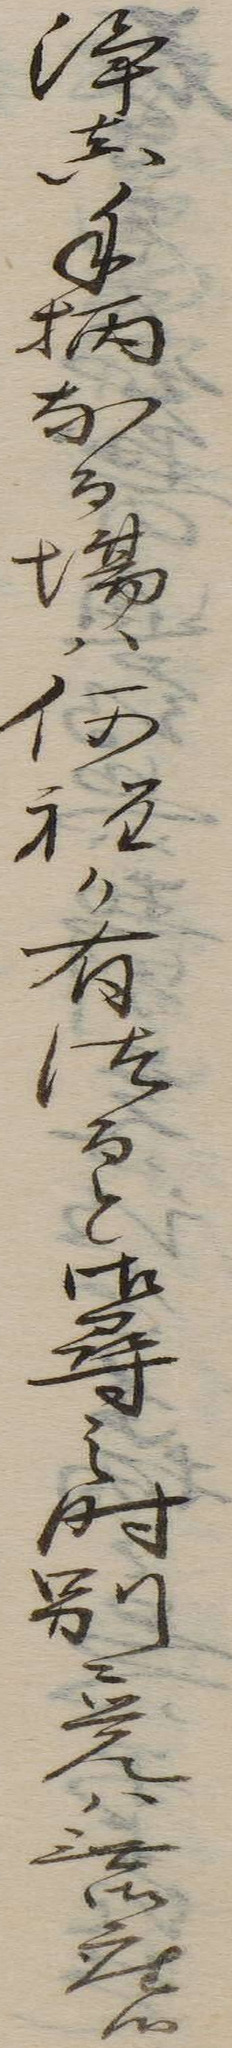浄真手柄なる場は何程か有つると御尋之時別に覚は無御座候
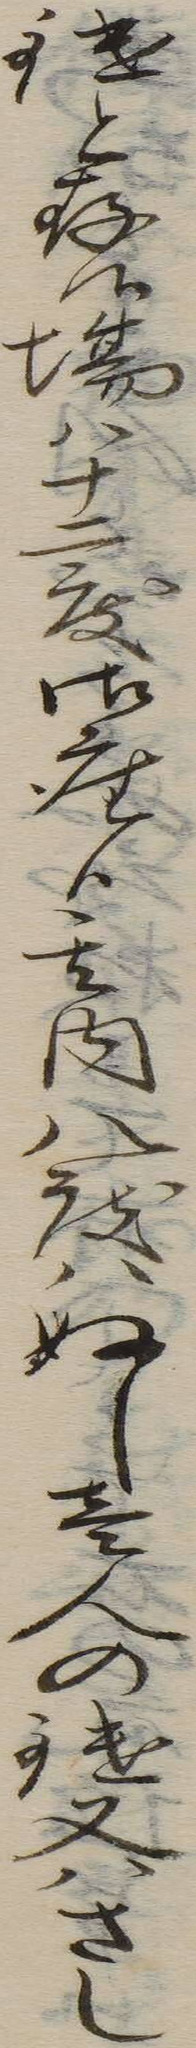鑓と存候場は十二度御座候其内八度はぬし壱人の鑓又はさし
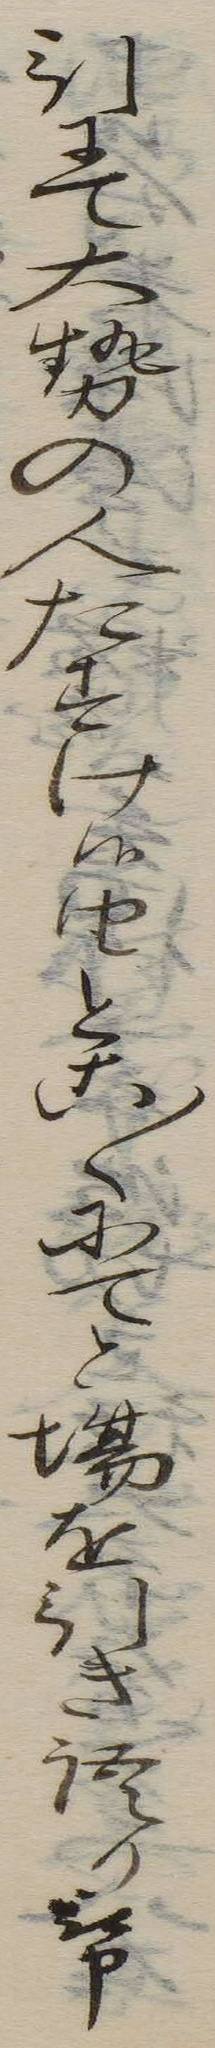引にて大勢の人たすけ候由とこ〳〵にてと場を引き語り被申
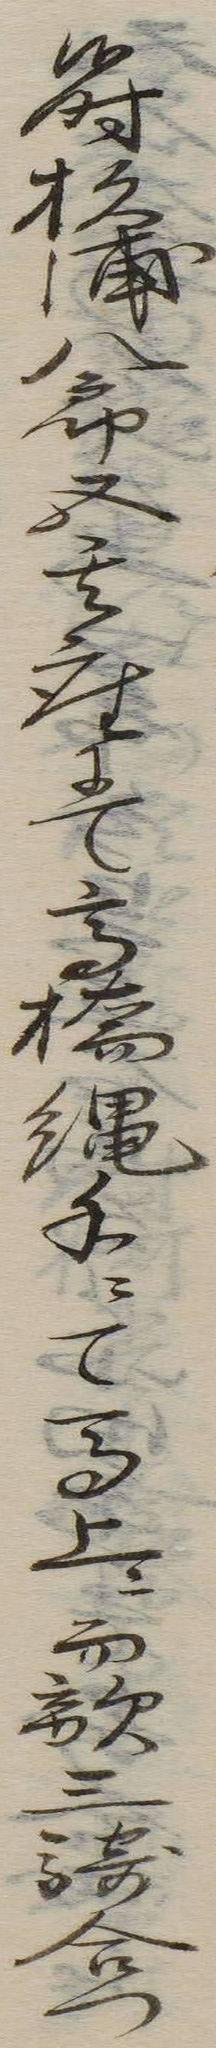候時杉浦八郎五其座にて高橋縄手ニて馬上ニ而敵三騎合つ
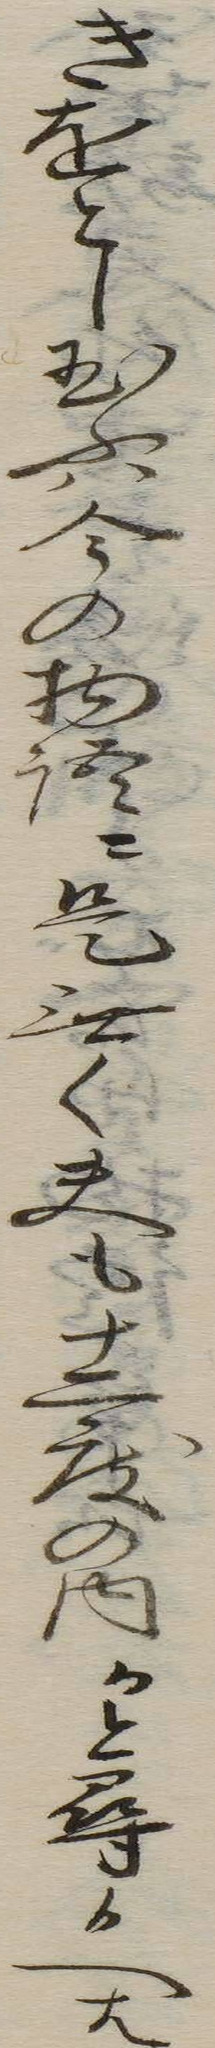きをとし玉ふは今の物語ニ是無く夫も十二度の内かと尋候へは
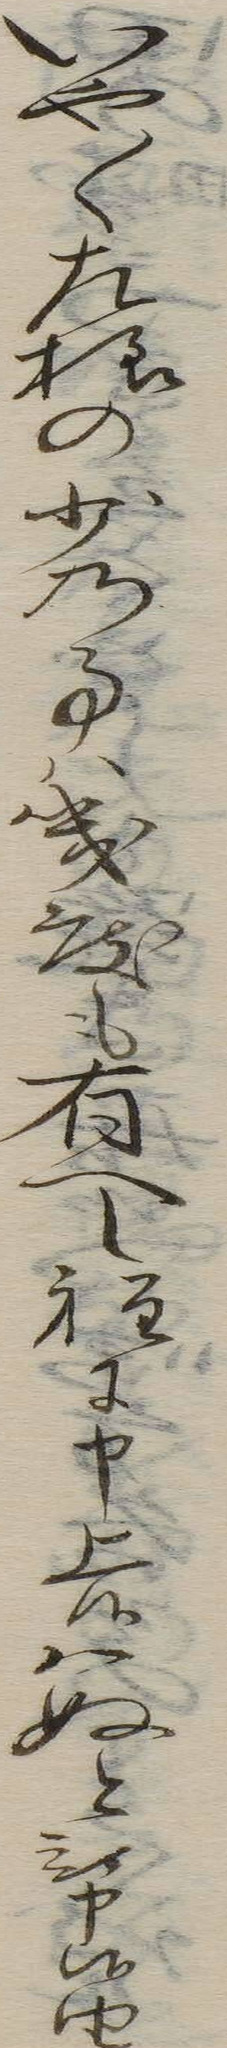いや〳〵左様の少の事は幾度も有へし程に申上候はぬと被申候由
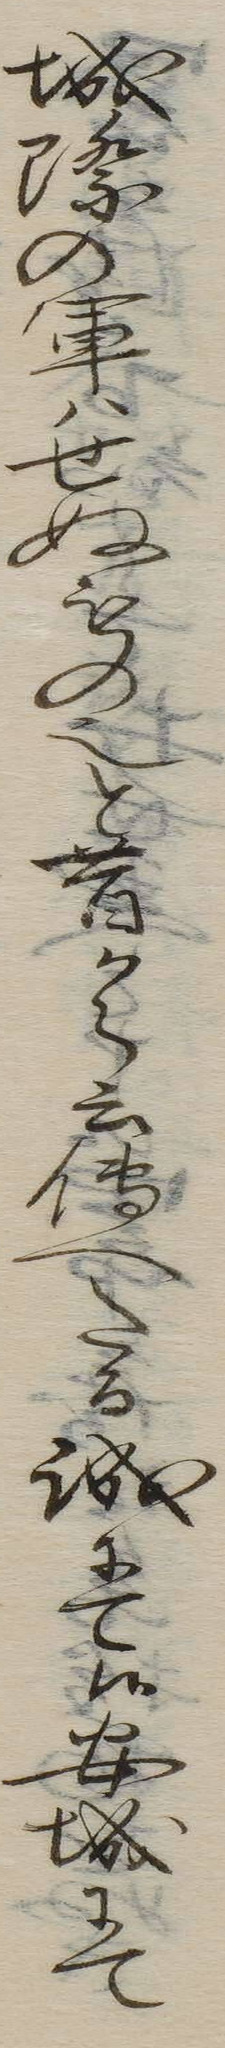一城際の軍はせぬもの也と昔から云伝へたる誠にて候安城にて
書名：三河之物語
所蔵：国文学研究資料館
